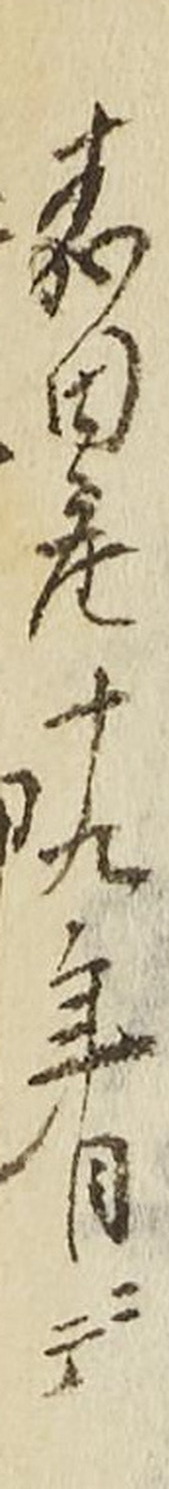森田座十九年目ニテ
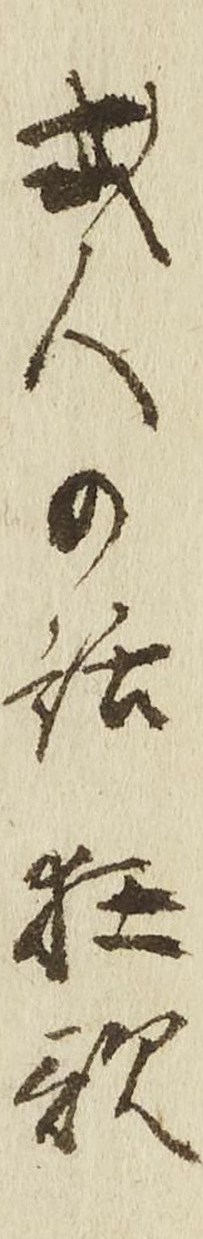或人の話狂歌
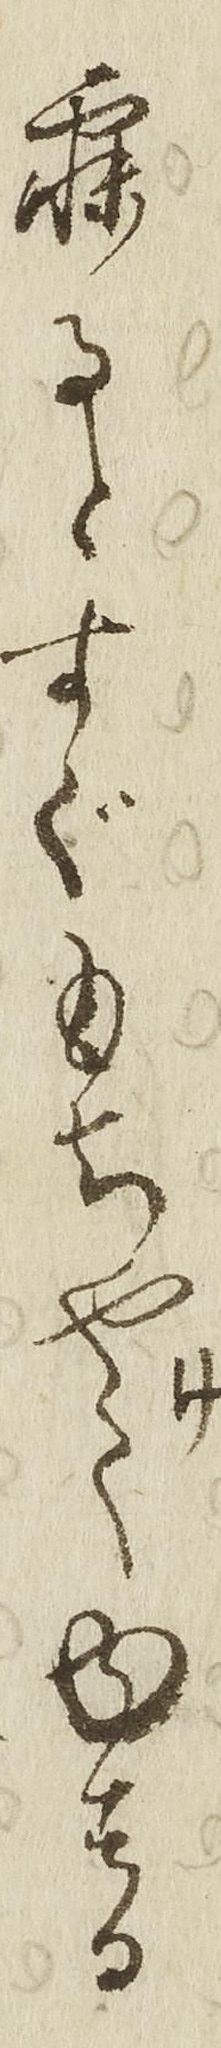寝るとすぐもちやげてゆする
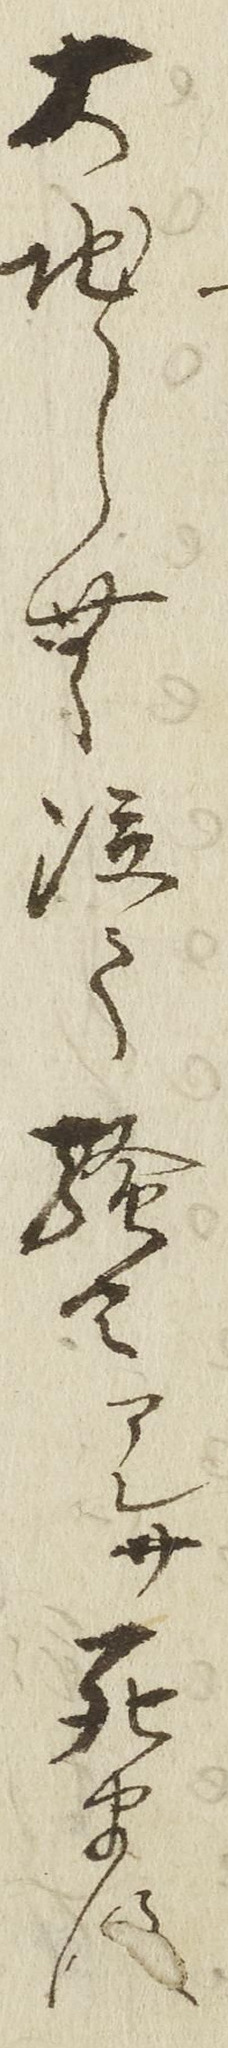大地しむ泣て騒てアレサ死ます
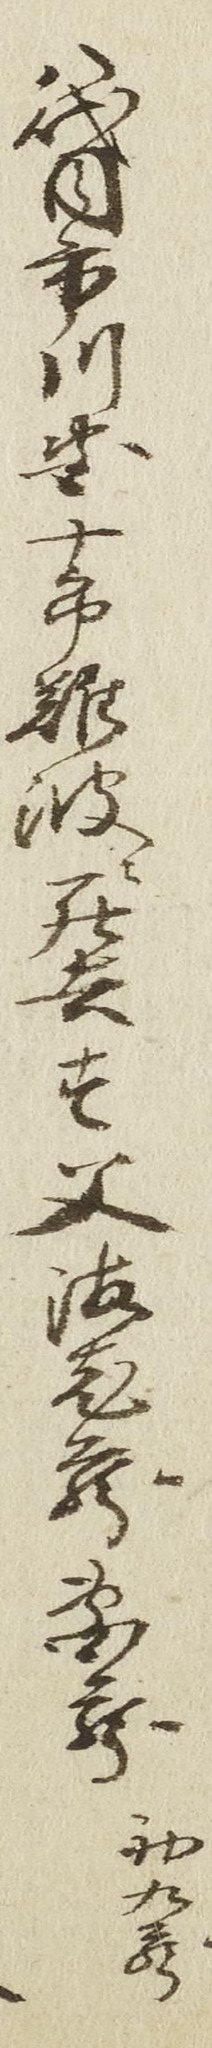八代目市川団十郎難波ニ死去す父海老蔵団蔵初九蔵
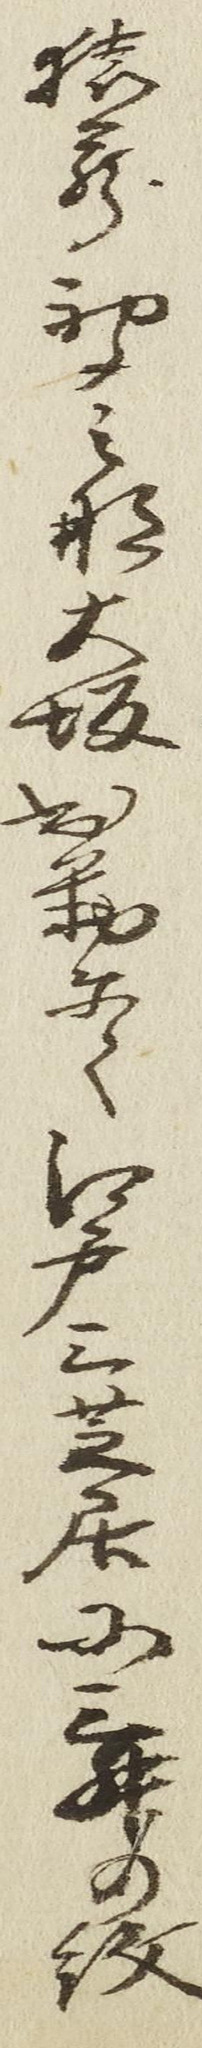猿蔵初メみな大坂出勤にて江戸三芝居に三升の紋
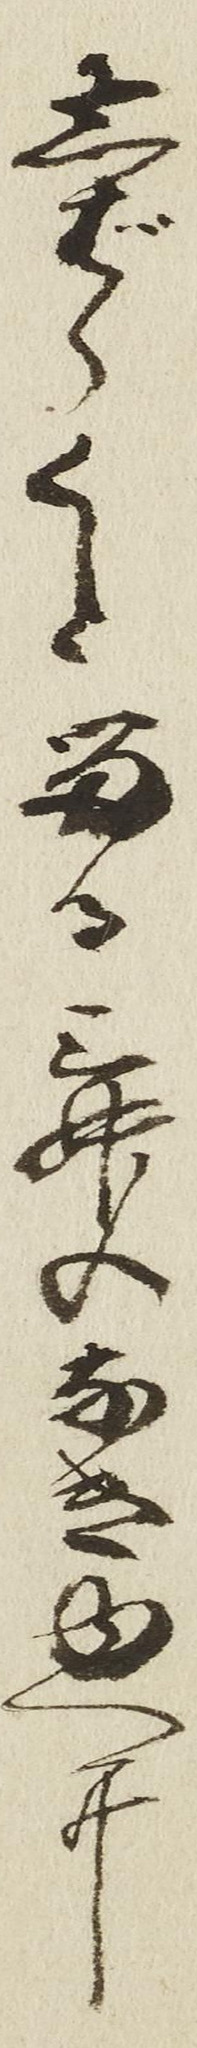しばらくと留る三升のなきゆへに
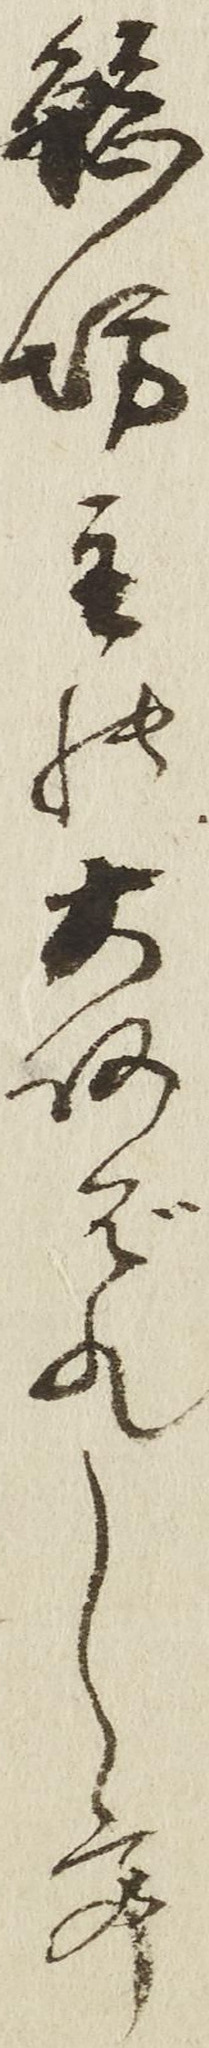鯰坊主の大あばれして
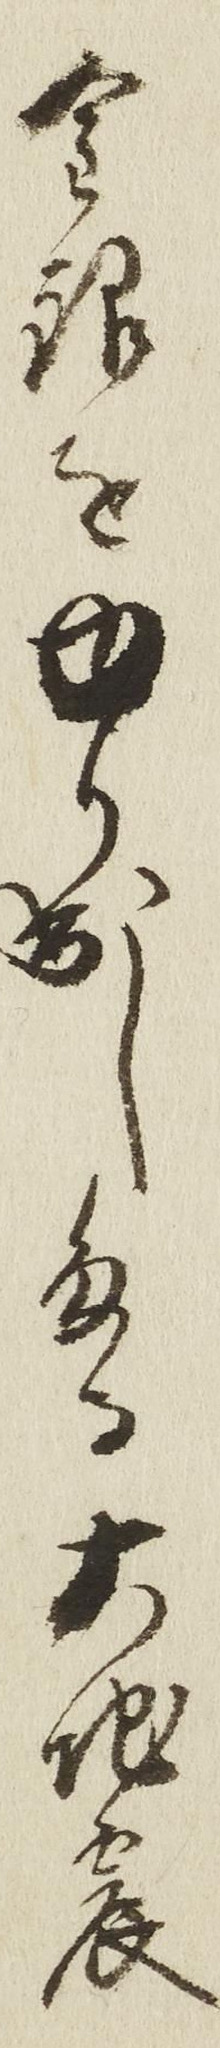金銀をゆり出したる大地震
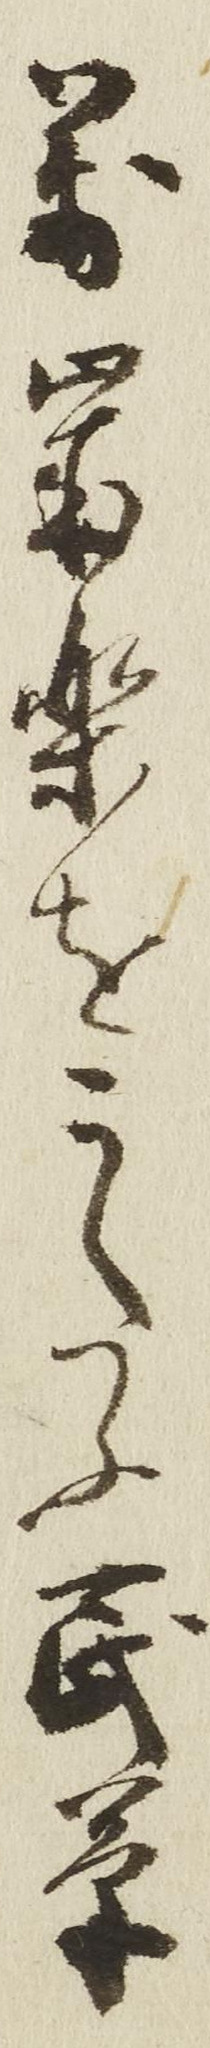万歳楽をうたふ民草
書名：安政二年震災記事　完
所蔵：東京大学地震研究所図書室 Earthquake Research Institute Library, The University of Tokyo, JAPAN
